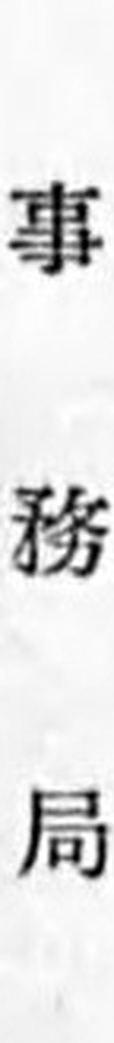事務局
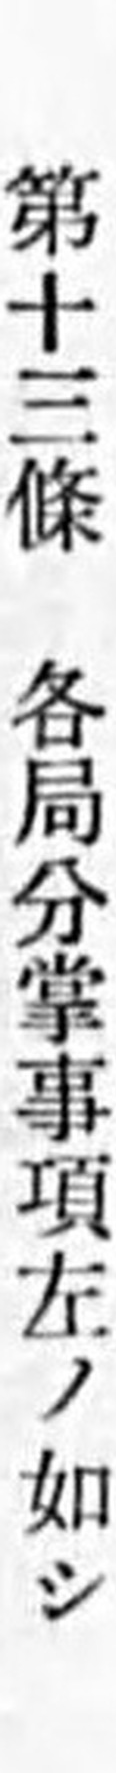第十三条各局分掌事項左ノ如シ
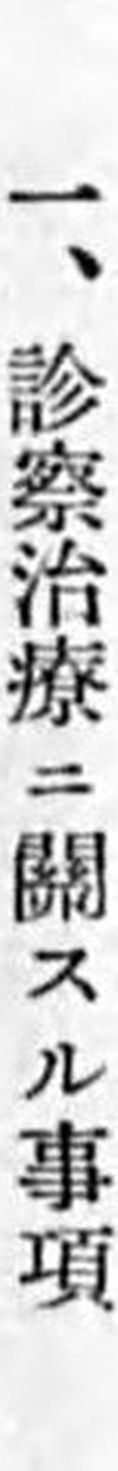一、診察治療ニ関スル事項
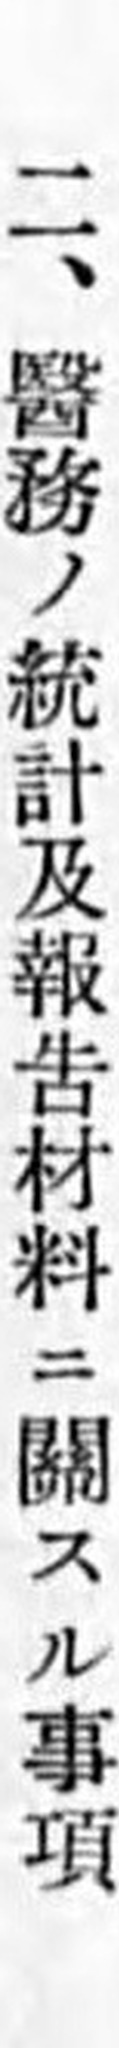二、医務ノ統計及報告材料ニ関スル事項
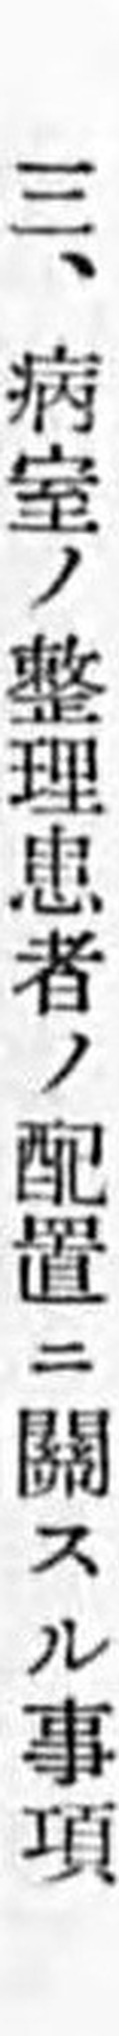三、病室ノ整理患者ノ配置ニ関スル事項
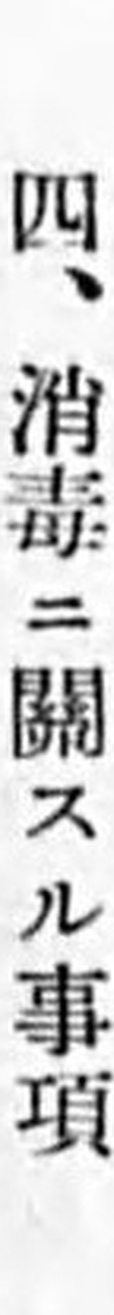四、消毒ニ関スル事項
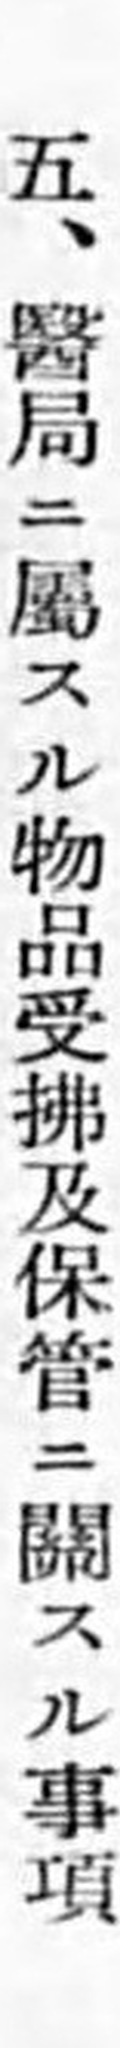五、医局ニ属スル物品受払及保管ニ関スル事項
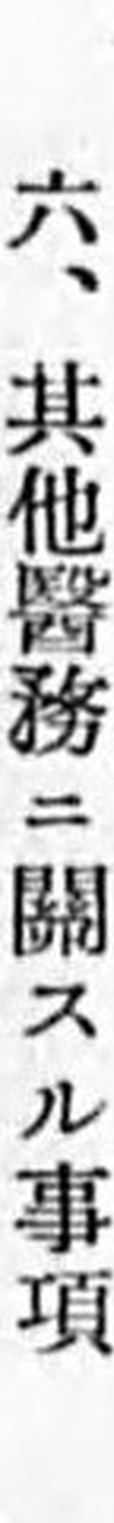六、其他医務ニ関スル事項
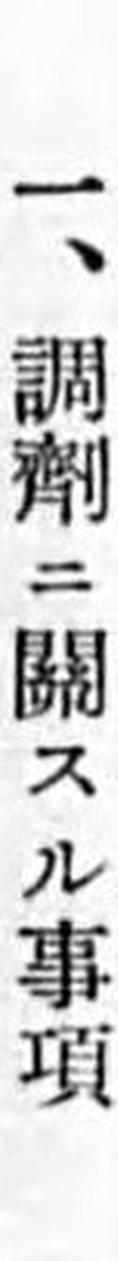一、調剤ニ関スル事項
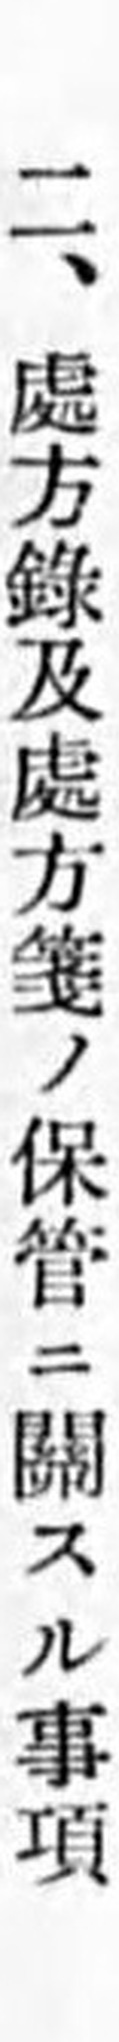二、処方録及処方箋ノ保管二関スル事項
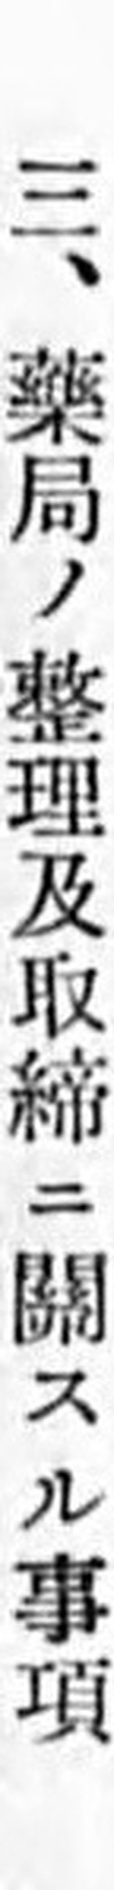三、薬局ノ整理及取締ニ関スル事項
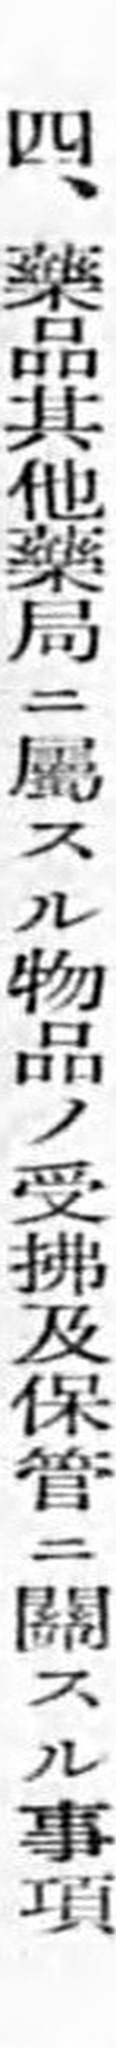四、薬品其他薬局ニ属スル物品ノ受払及保管ニ関スル事項

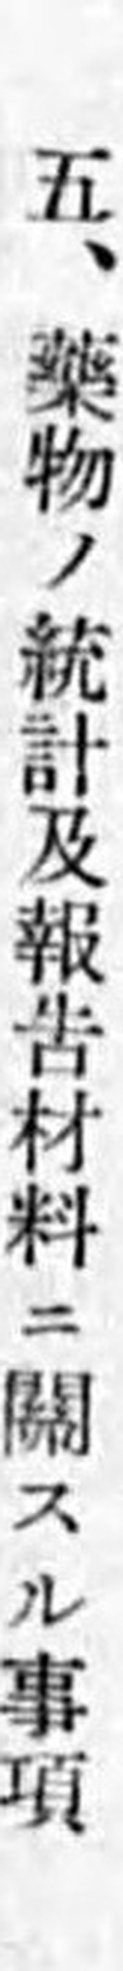五、薬物ノ統計及報告材料ニ関スル事項
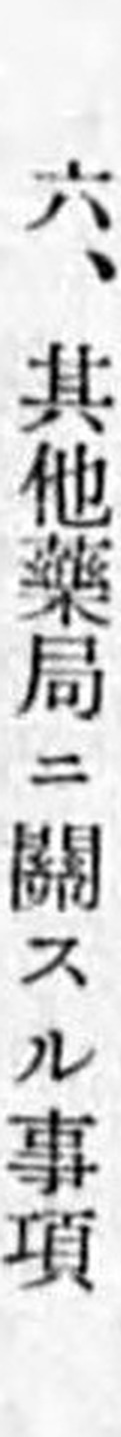六、其他薬局ニ関スル事項
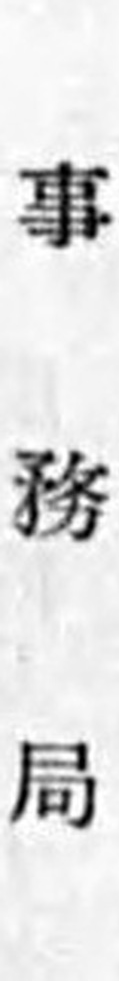事務局
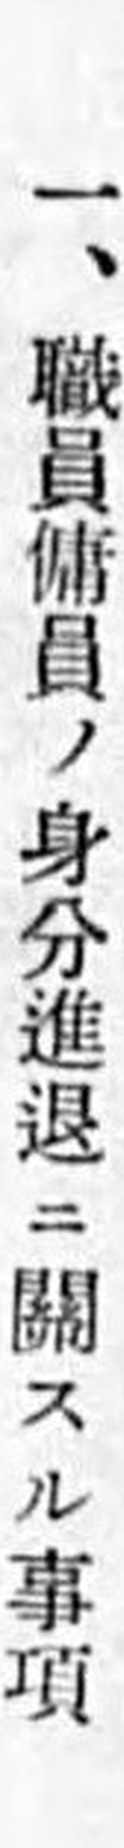一、職員傭員ノ身分進退ニ関スル事項
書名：豊橋市立高山病院年報. 昭和12年度
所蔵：国立国会図書館 National Diet Library, JAPAN
